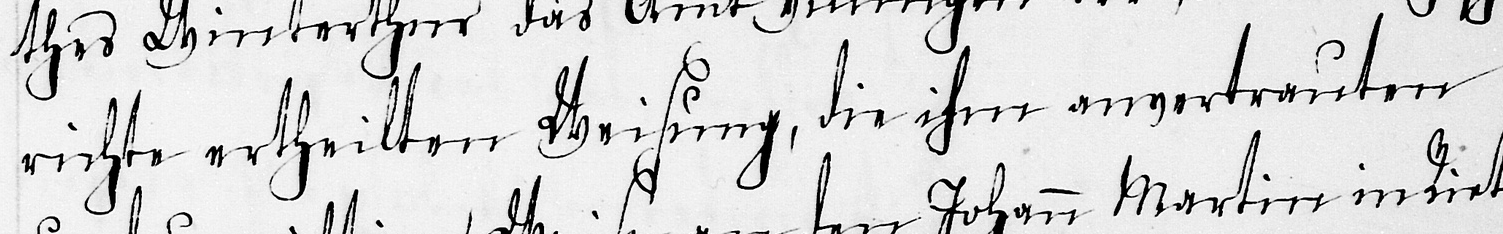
richte ertheilten Weisung, die ihm anvertrauten
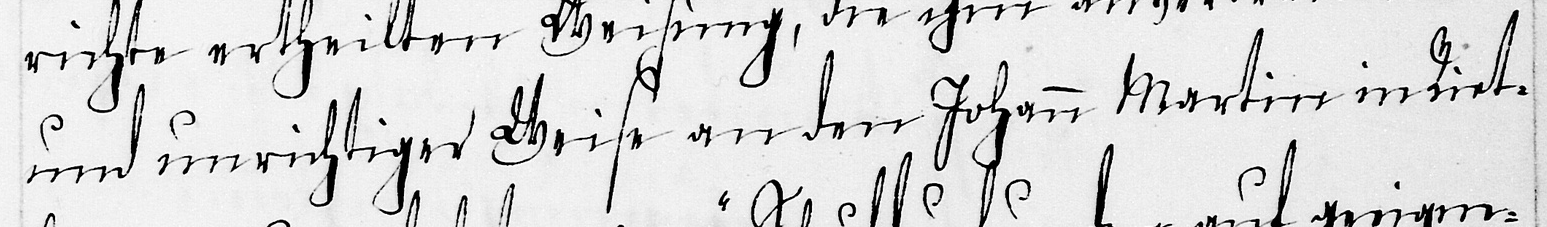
und um richtiger Weise an den Johann Martin in Riet¬
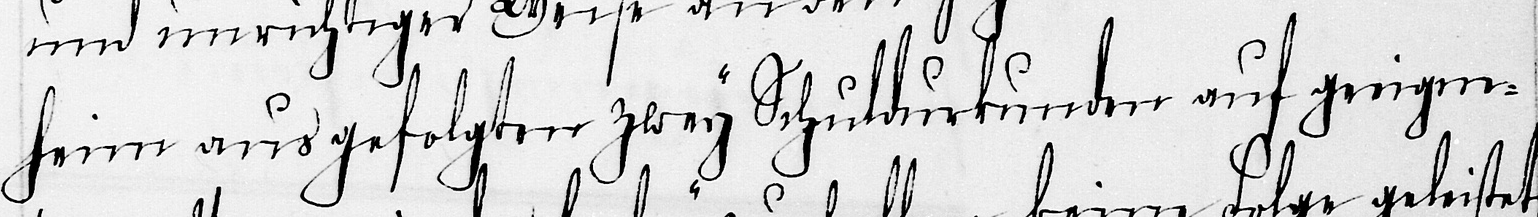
heim ausgefolgten zwey Schuldurkunden auf geeigne¬
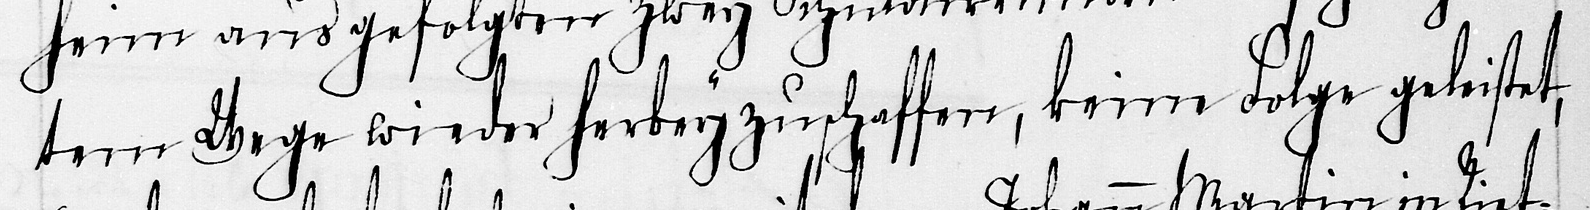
tem Wege wieder herbey zu schaffen, keine Folge geleistet,
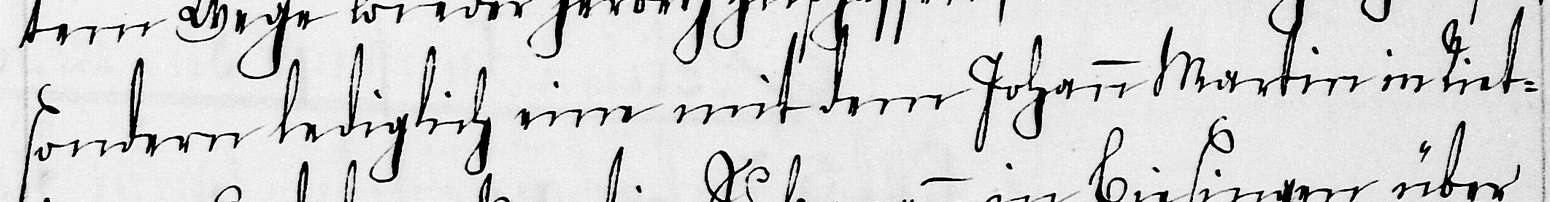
sondern lediglich eine mit dem Johann Martin in Riet¬
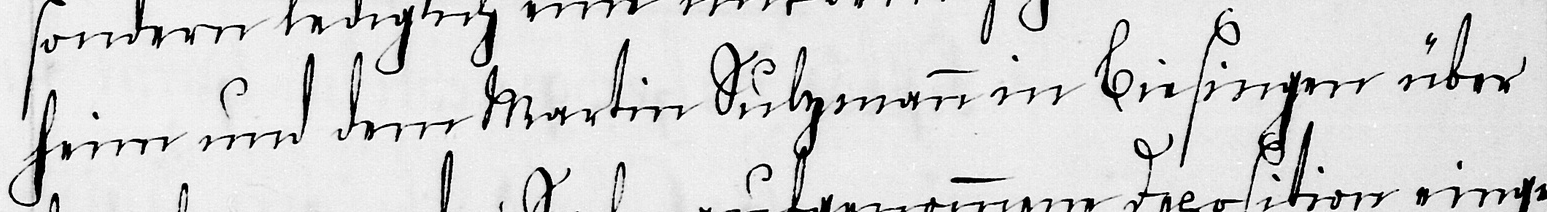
heim und dem Martin Sulzmann in Biesingen über
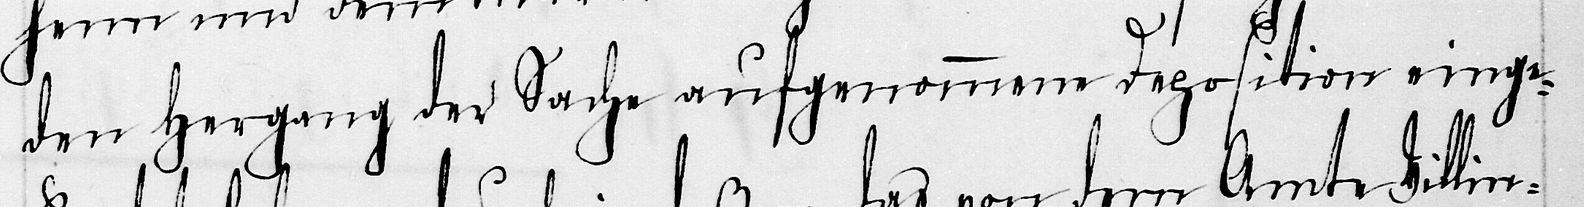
den Hergang der Jahre aufgenommene Deposition einge¬
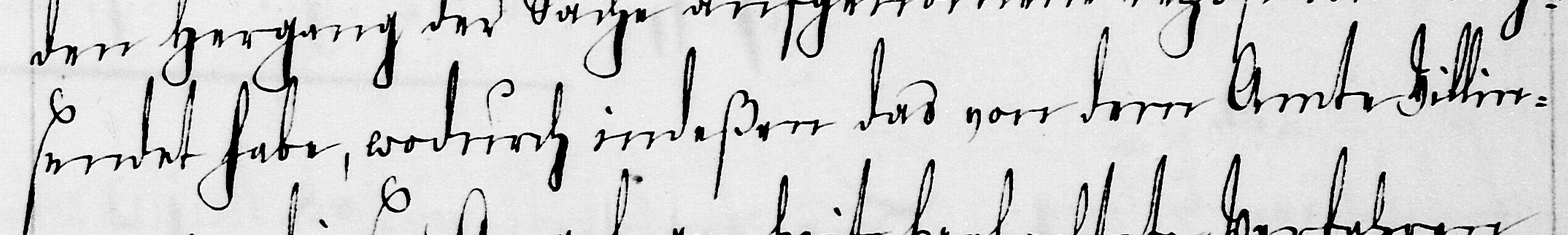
sendet habe, wodurch indeßen das von dem Amte Villin¬
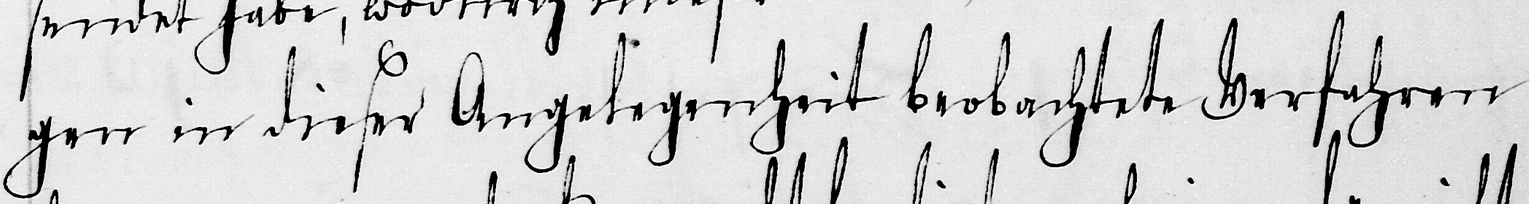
gen in dieser Angelegenheit beobachtete Verfahren
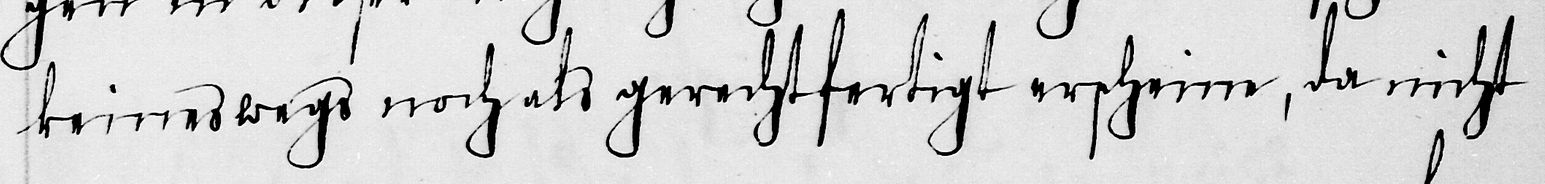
keineswegs noch als gerechtfertigt erscheine, da nicht
